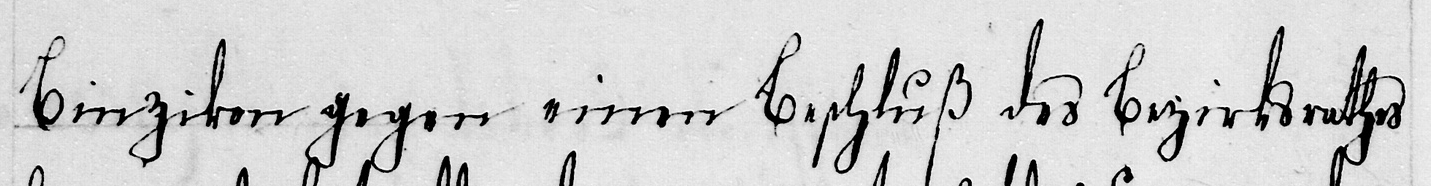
Binzikon gegen einen Beschluß des Bezirksrathes
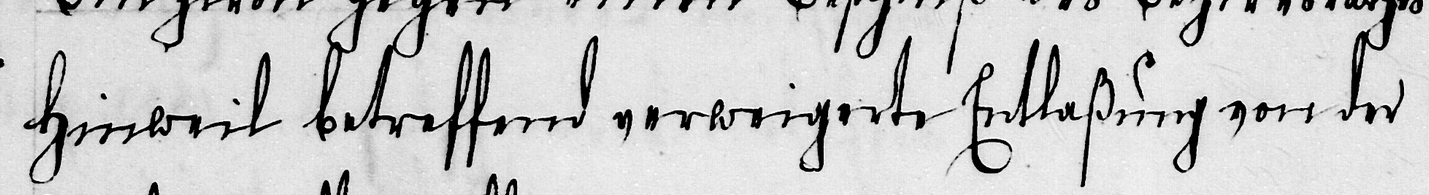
Hinweil betreffend verweigerte Entlaßung von der
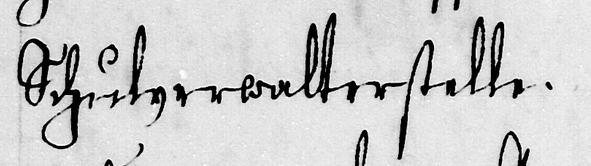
Schulverwalterstelle.
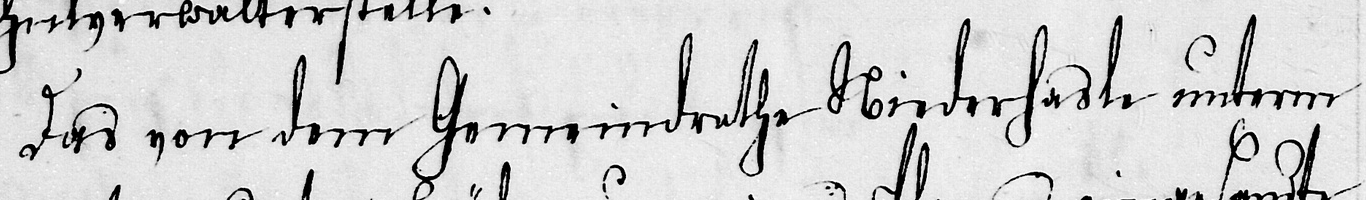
Das von dem Gemeindrathe Niederhasle unterm
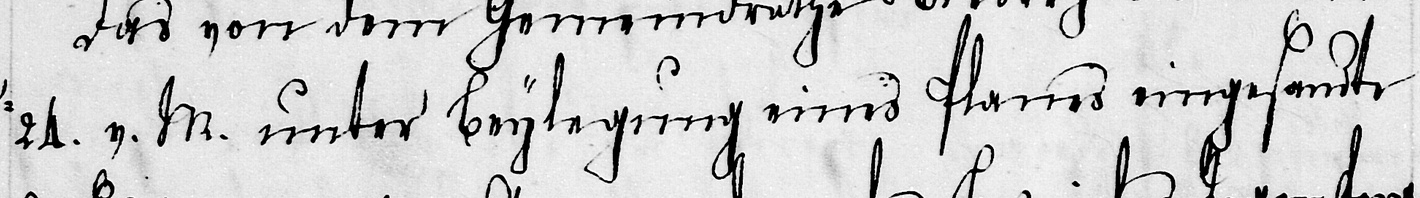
24. v. M. unter Beylegung eines Planes eingesandte
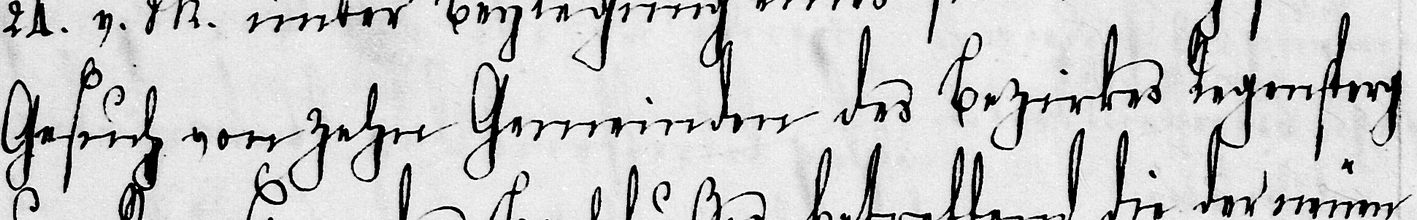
Gesuch von zehn Gemeinden des Bezirkes Regensperg
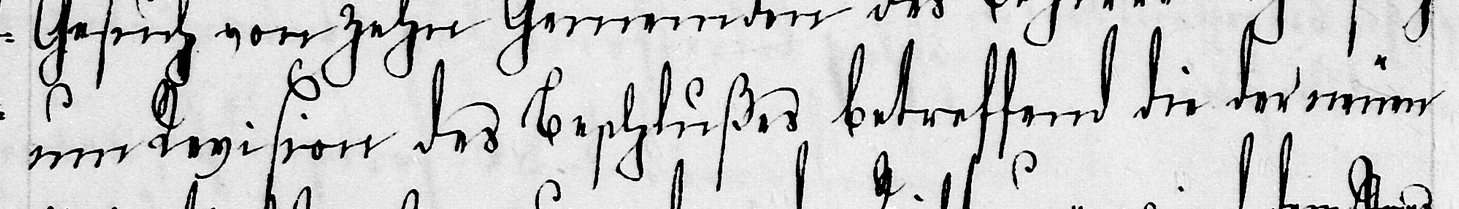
um Revision des Beschlußes betreffend die der neuen
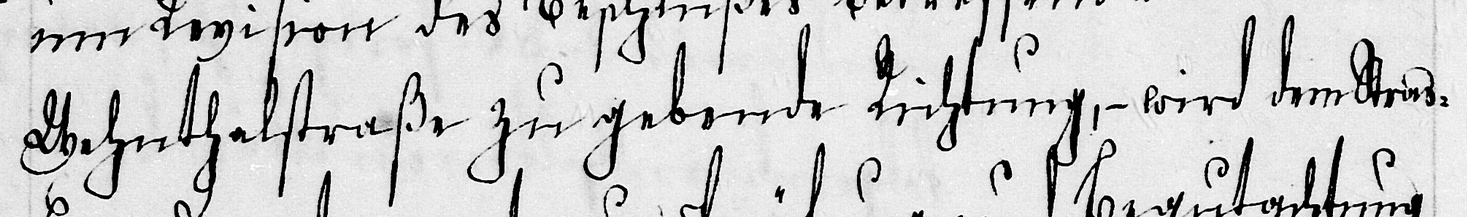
Wehnthalstraße zu gebende Richtung, – wird dem Stra¬
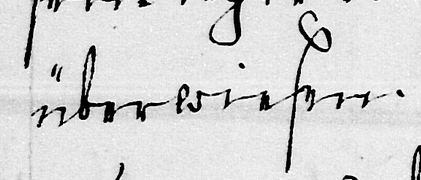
überwiesen.
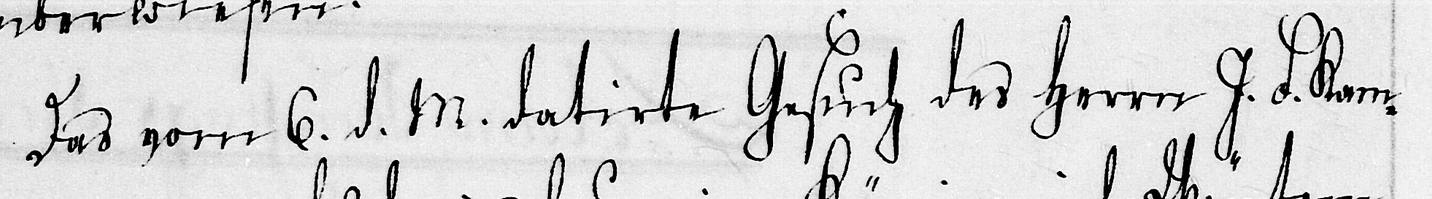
Das vom 6. d. M. datirte Gesuch des Herrn J. F. Ka¬
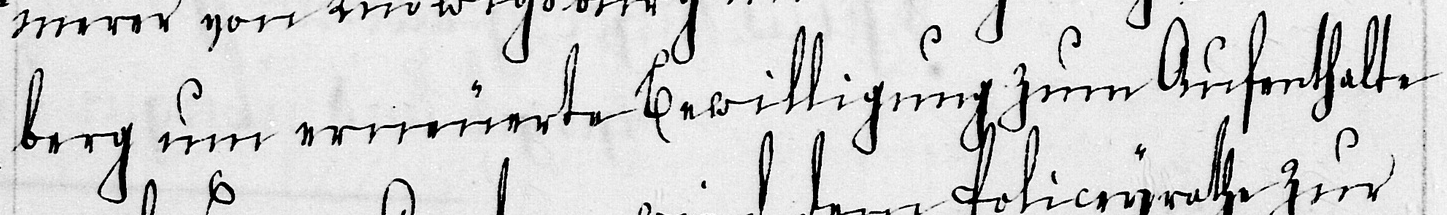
berg um erneuerte Bewilligung zum Aufenthalte
